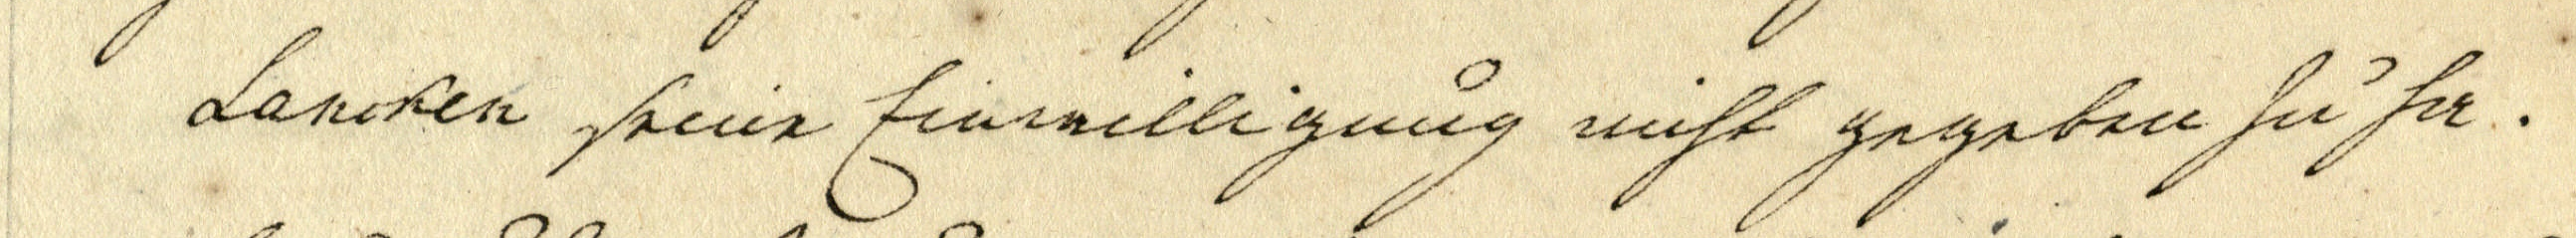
Lancken seine Einwilligung nicht gegeben zu ha¬
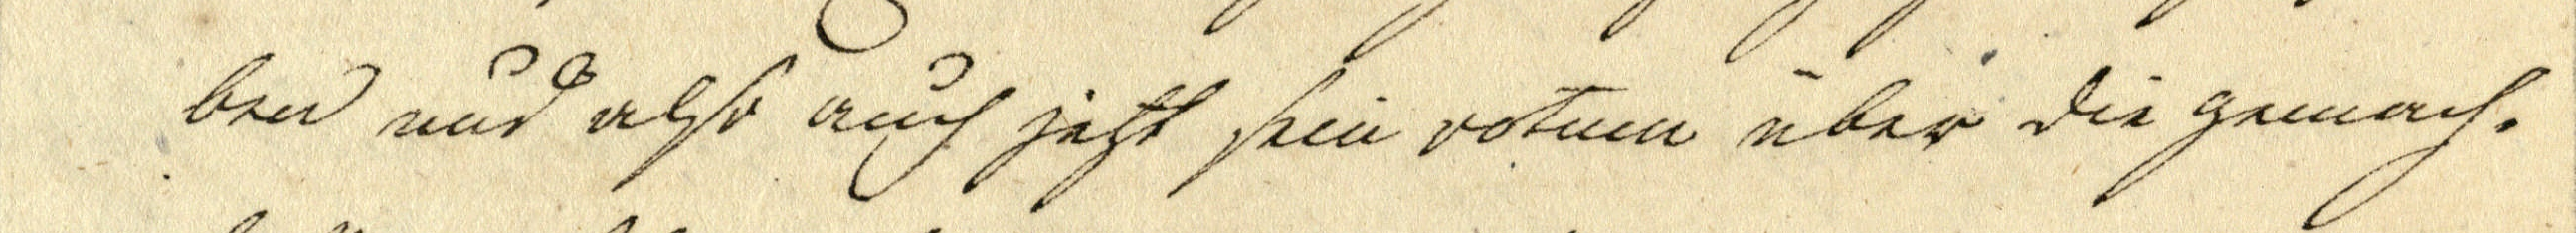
ben und also auch jetzt sein votum über die gemach¬
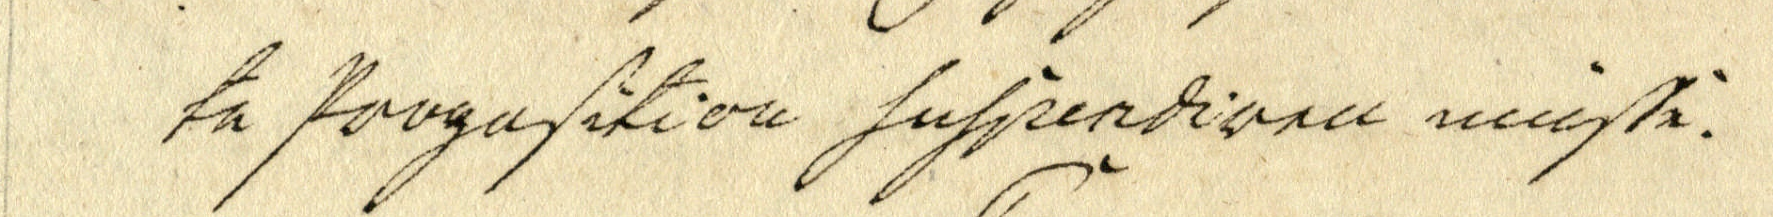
te Proposition suspendiren müsse.
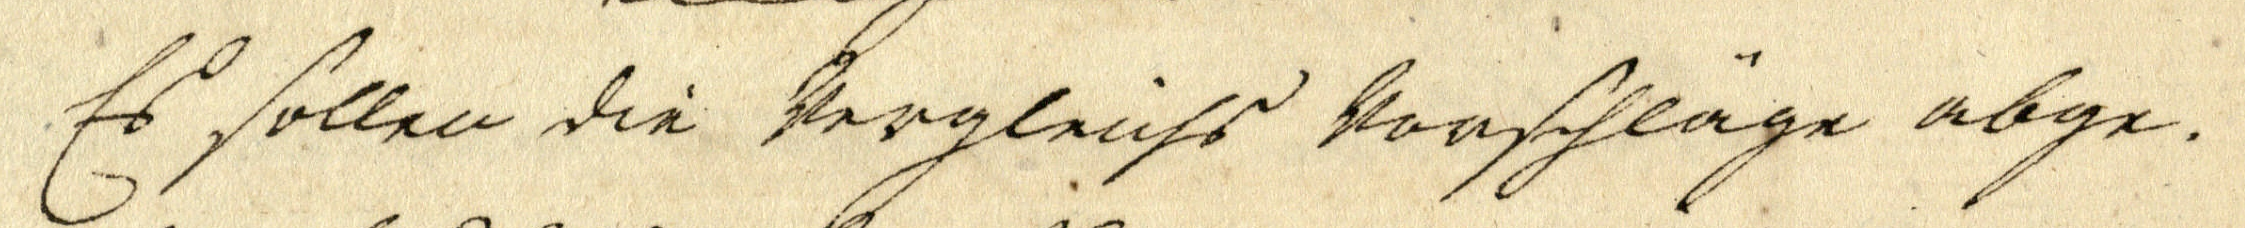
Es sollen die Vergleichs Vorschläge abge¬
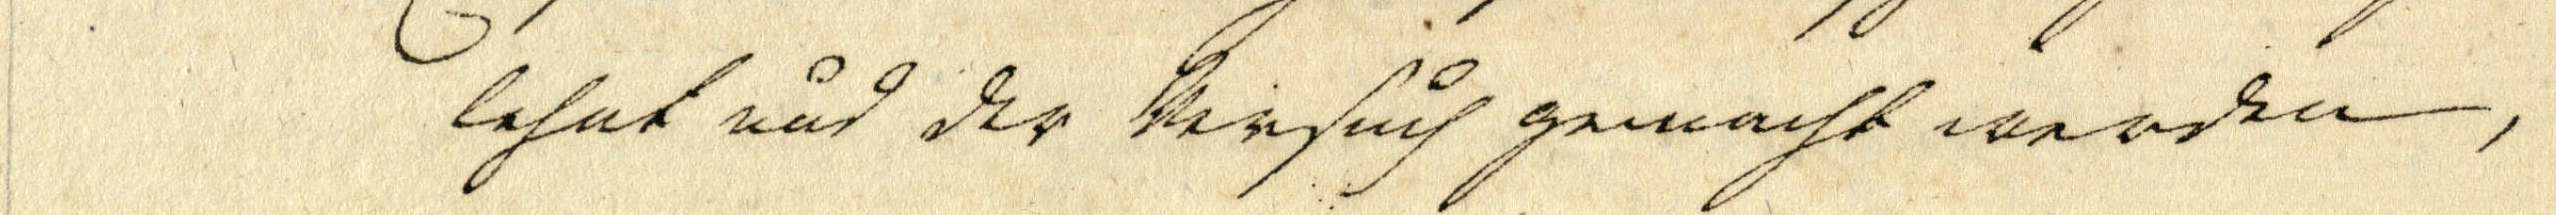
lehnt und der Versuch gemacht werden,
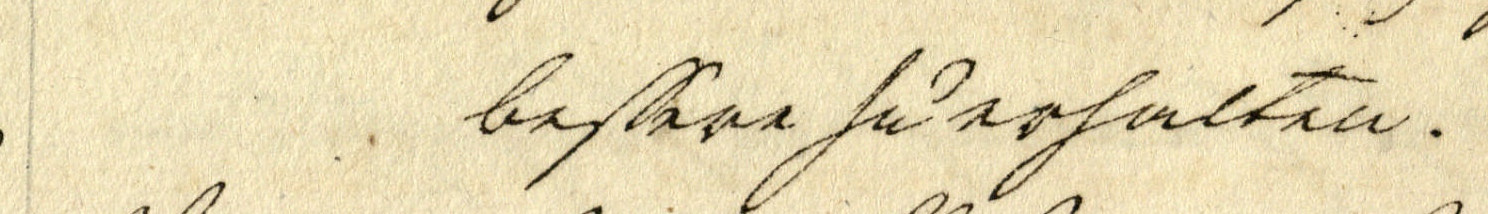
bessere zu erhalten.
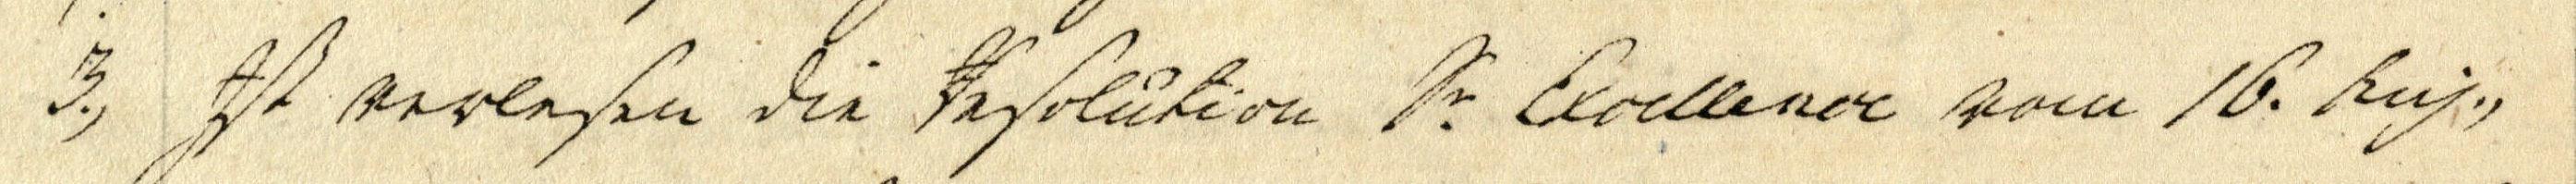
3. Ist verlesen die Resolution Sr. Excellence vom 16. huj.
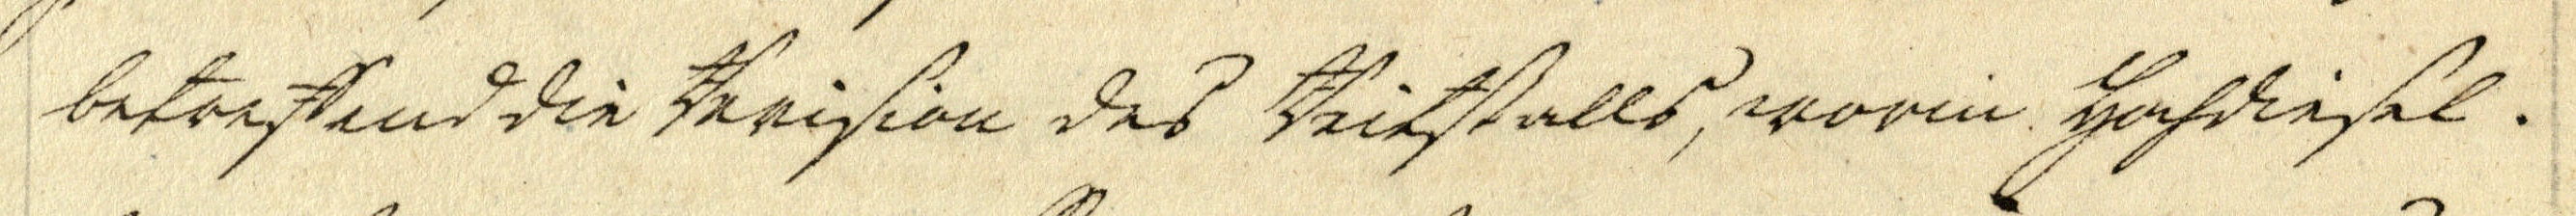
betreffend die Revision des Reitstalls, worin Hochdiesel¬
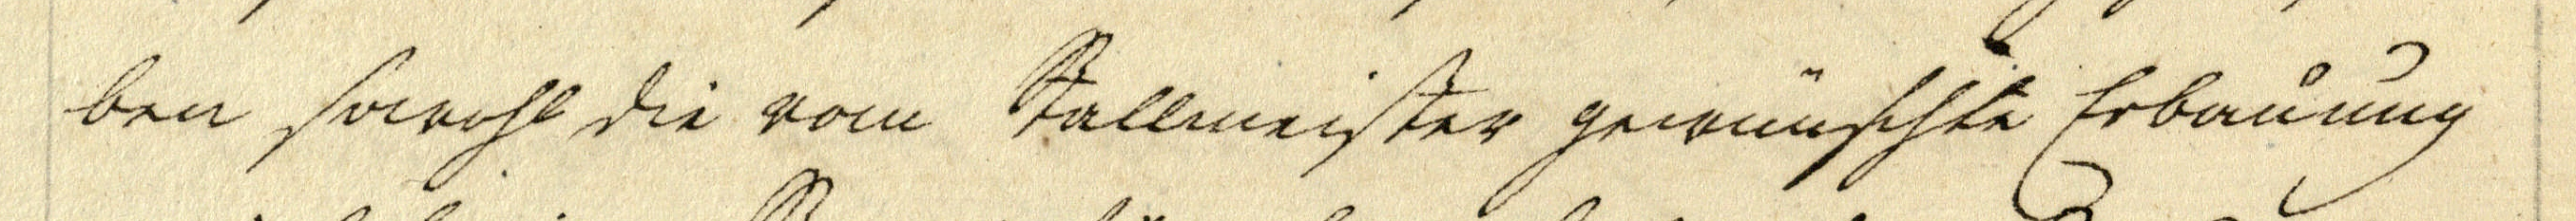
ben sowohl die vom Stallmeister gewünschte Erbauung
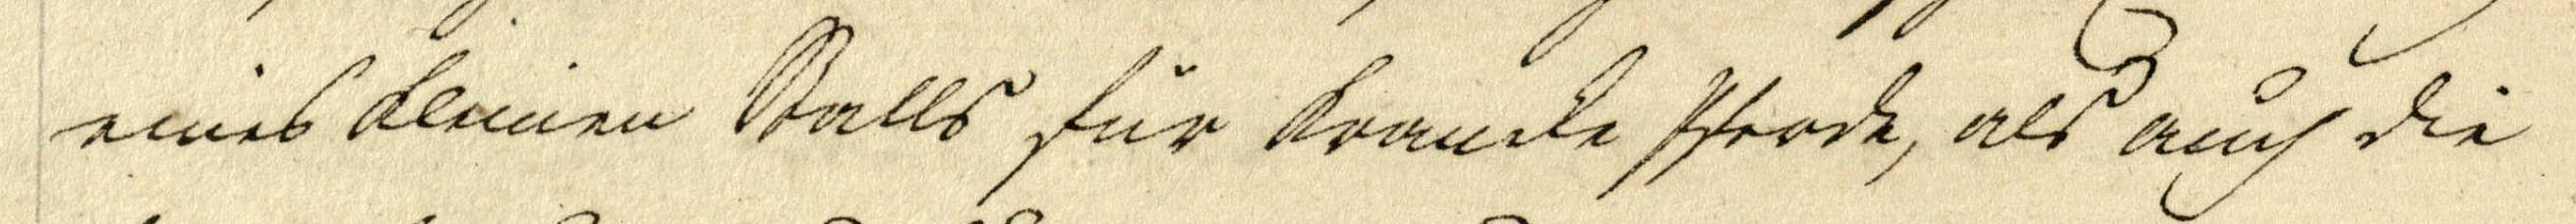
eines kleinen Stalls für kranke Pferde, als auch die
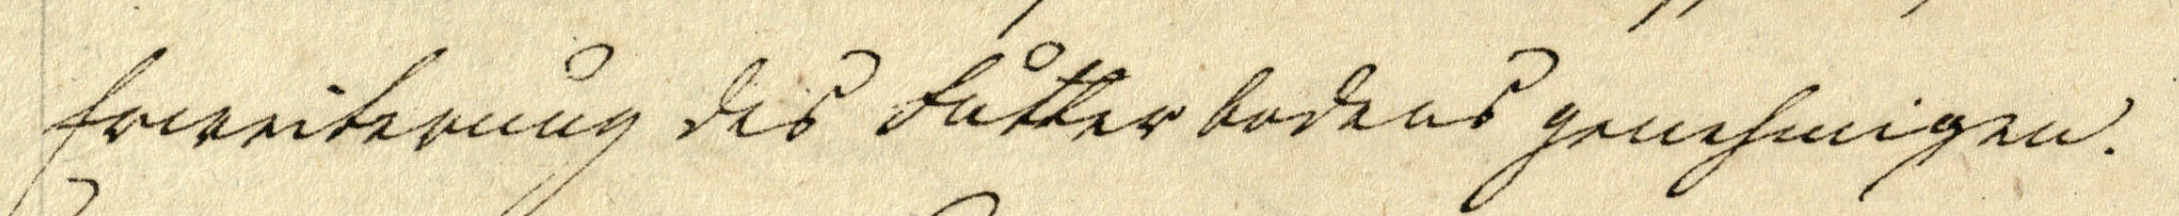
Erweiterung des Futterbodens genehmigen.
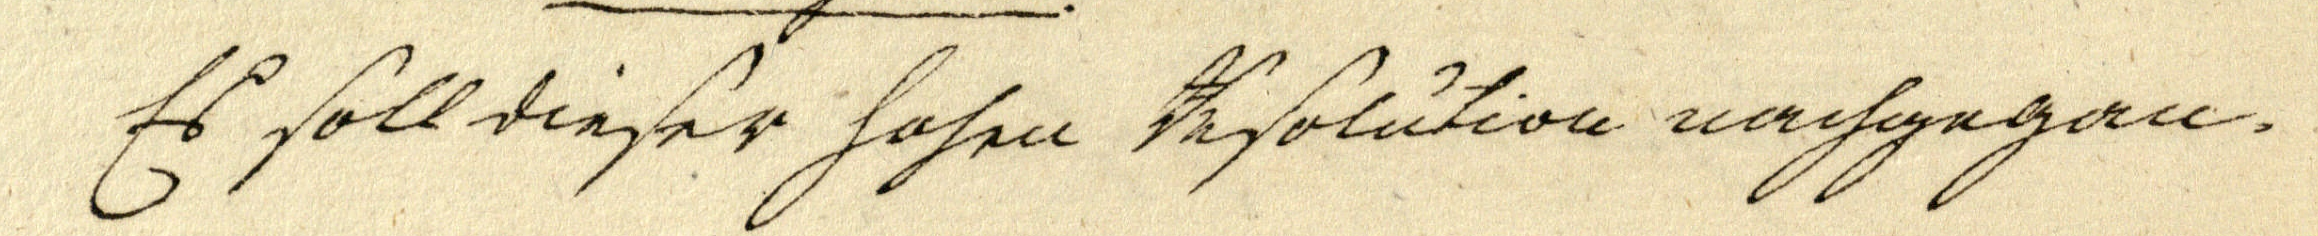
Es soll dieser hohen Resolution nachgegan¬
